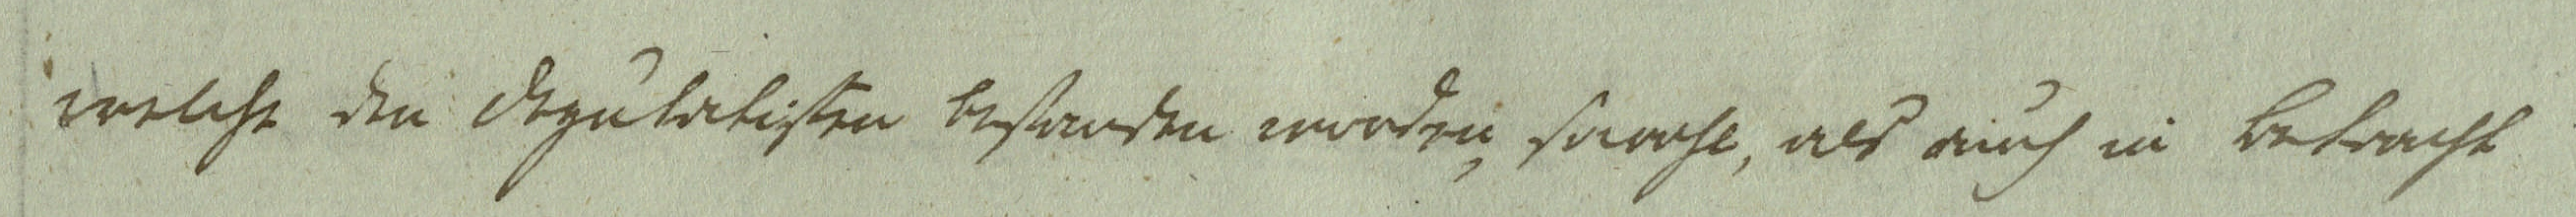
welche den Deputatisten bestanden worden sowohl, als auch in Betracht
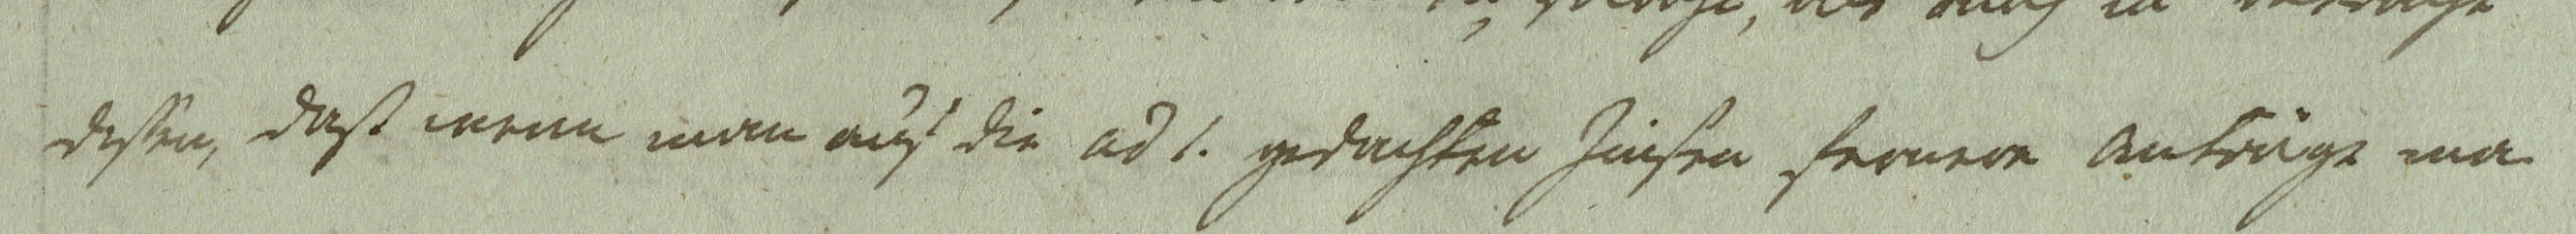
dessen, daß wenn man auf die ad 1. gedachten Zinsen fernere Anträge ma¬
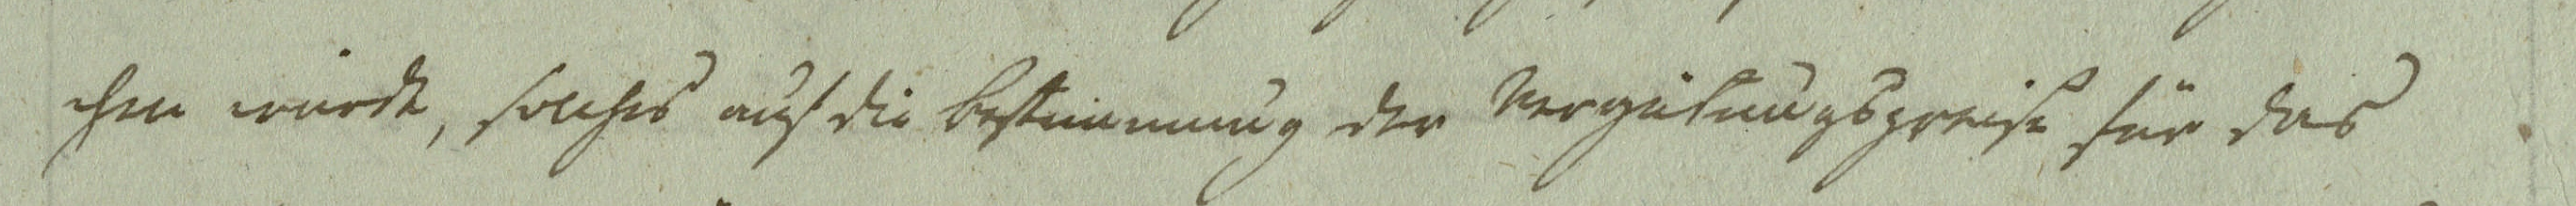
chen würde, solches auf die Bestimmung der Vergütungspreise für das
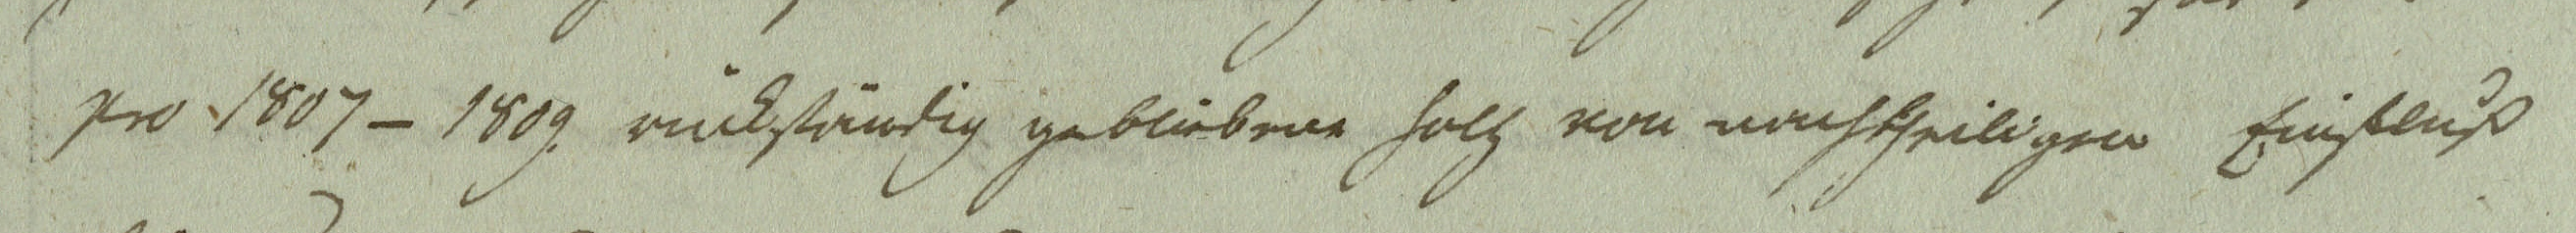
pro 1807 - 1809. rückständig gebliebene Holz von nachtheiligem Einfluß
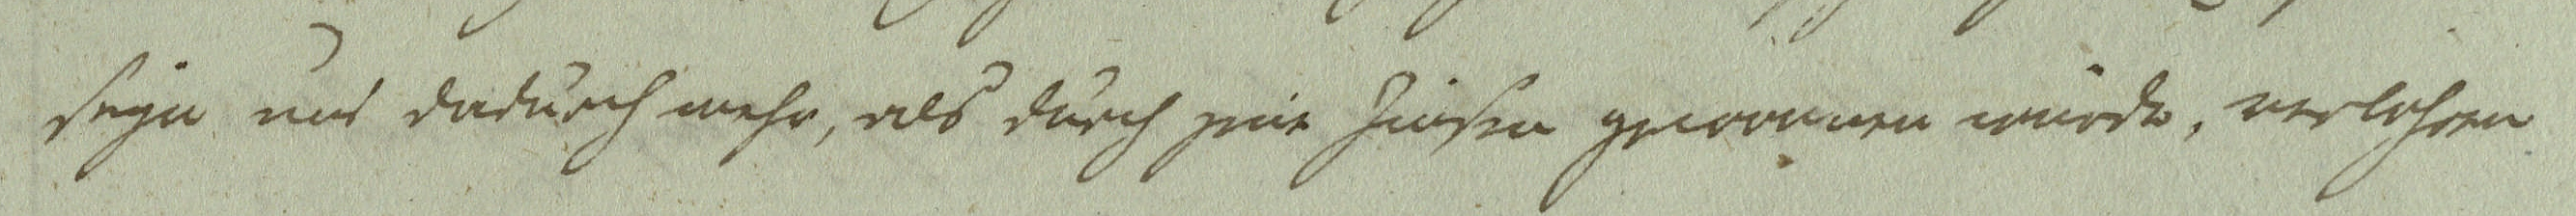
seÿn und dadurch mehr, als durch jene Zinsen gewonnen würde, verlohren
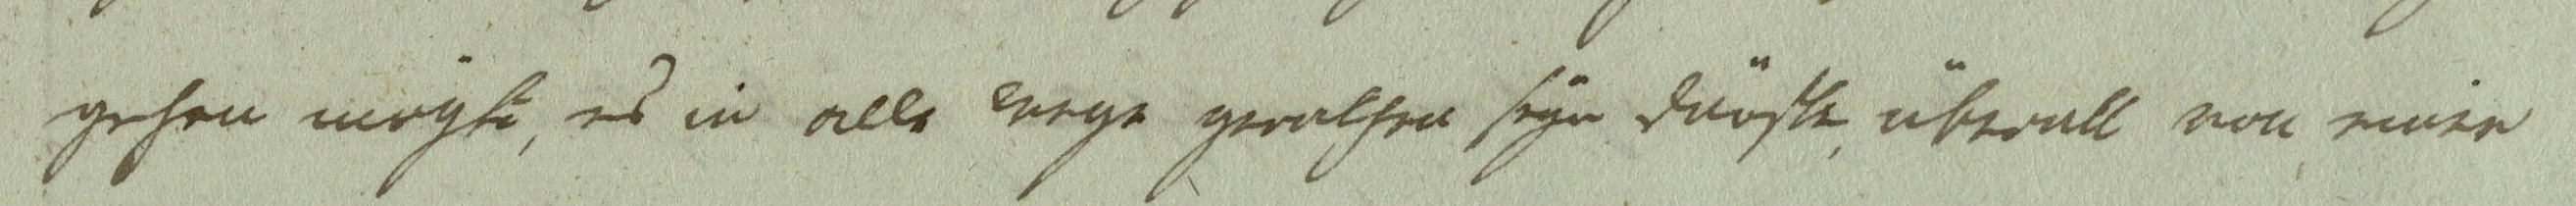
gehen mögte, es in alle Wege gerathen seÿn dürfte, überall von einer
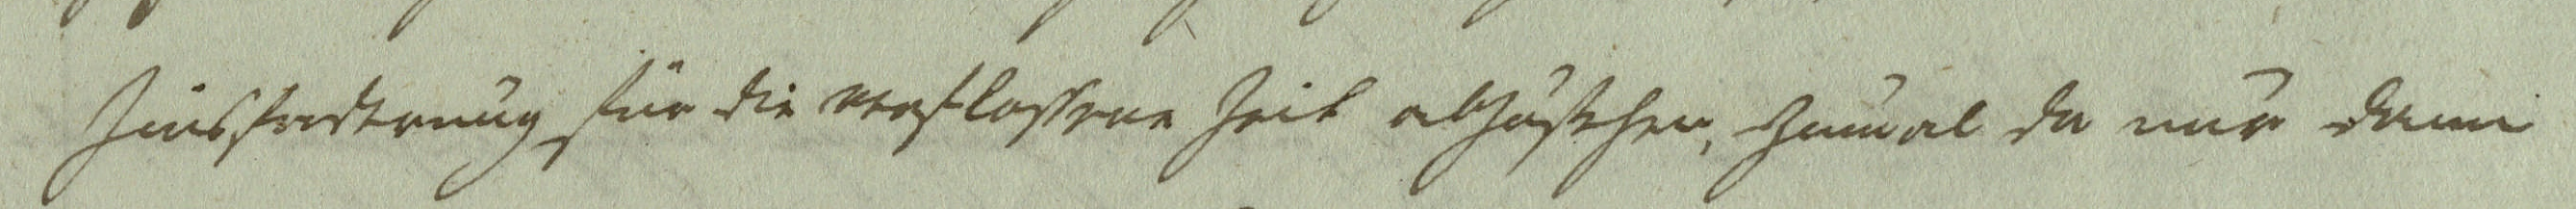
Zinsforderung für die verflossene Zeit abzusehen, zumal da nur dann
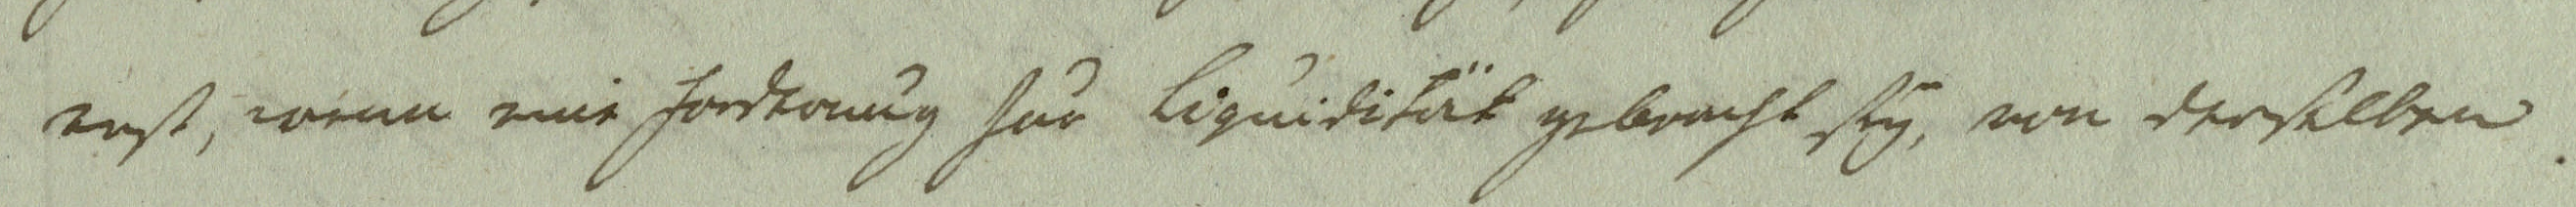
erst, wenn eine Forderung zur Liquidität gebracht seÿ, von derselben
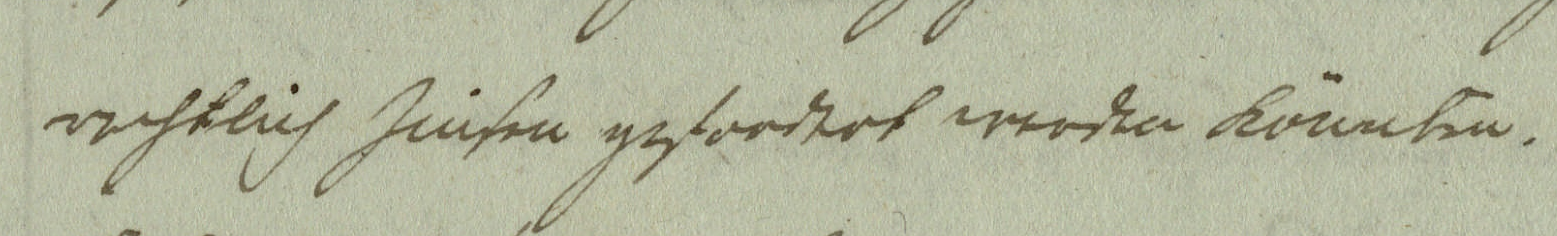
rechtlich Zinsen gefordert werden könnten.
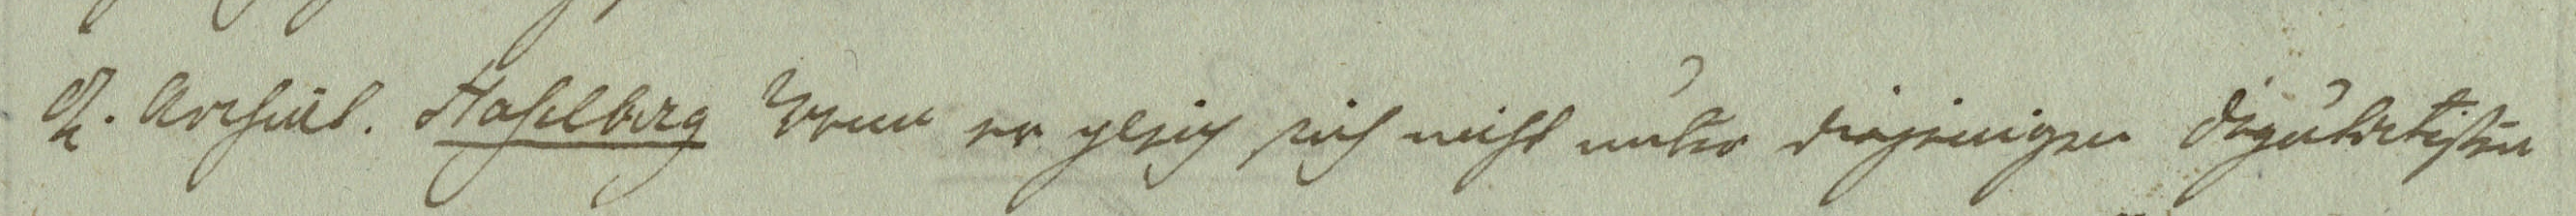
dh. Archiat. Haselberg Wenn er gleich sich nicht unter diejenigen Deputatisten
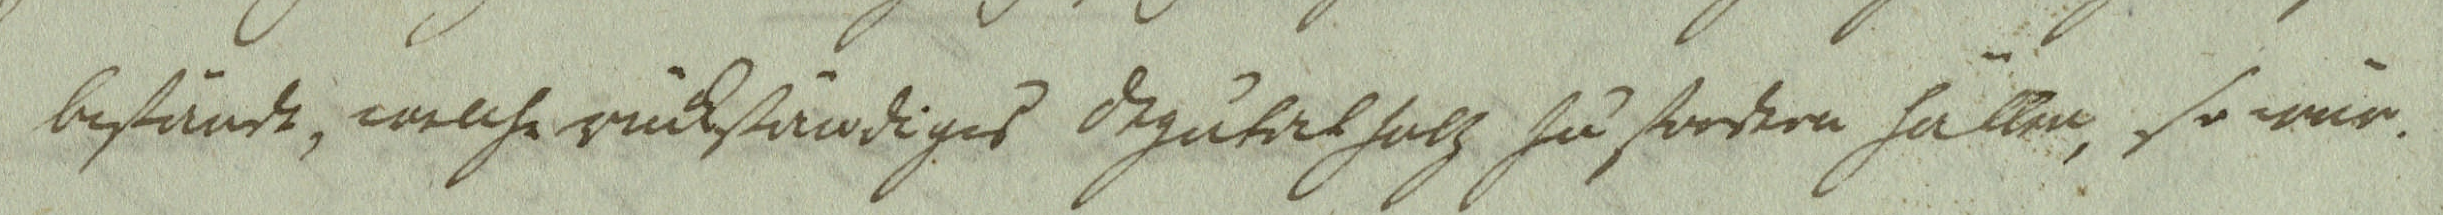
befände, welche rückständiges Deputatholz zu fordern hätten, so wür¬
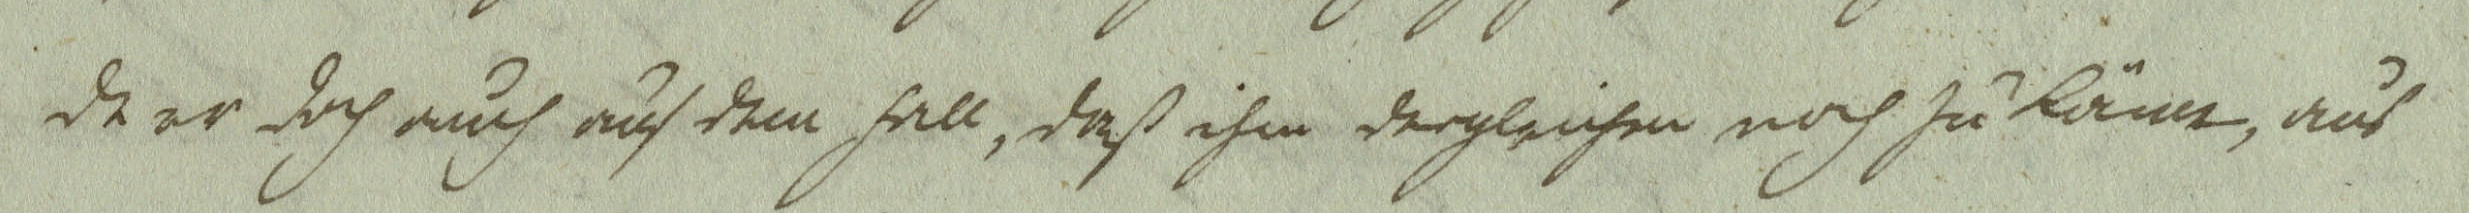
de er doch auch auf dem Fall, daß ihm dergleichen noch zu käme, aus
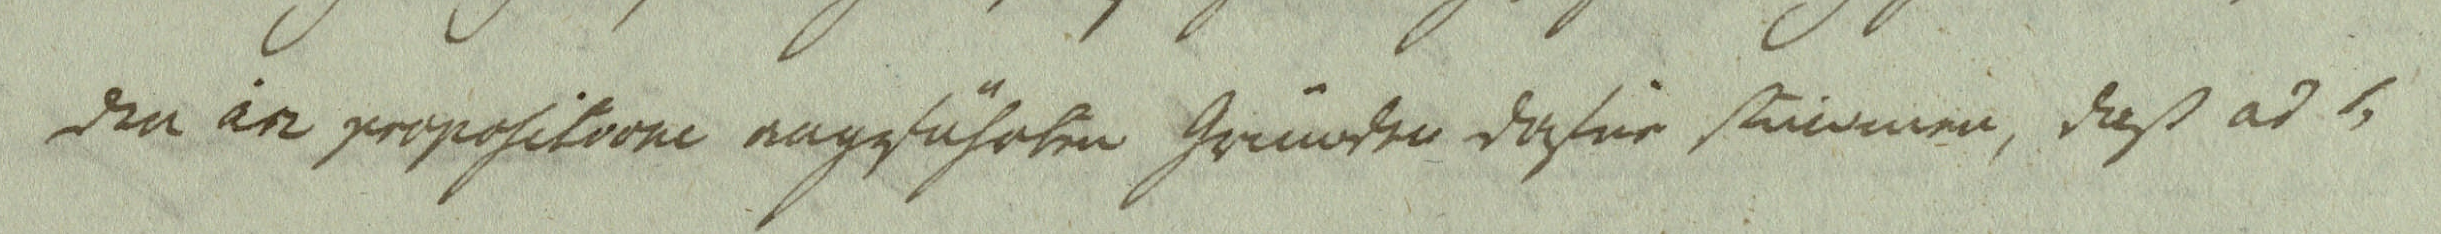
den in propositione angeführten Gründen dafür stimmen, daß ad 1,
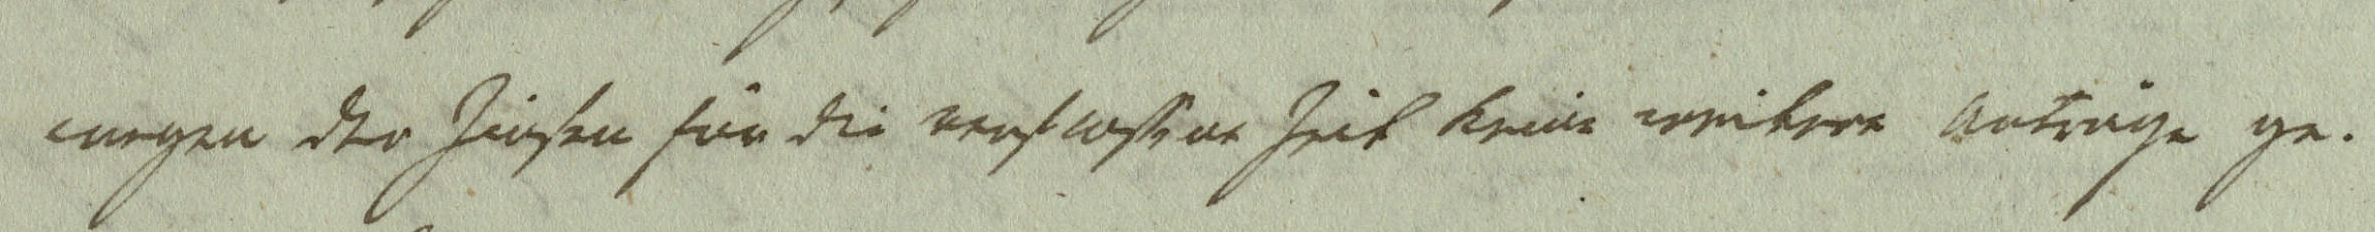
wegen der Zinsen für die verflossene Zeit keine weitere Anträge ge¬
